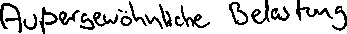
Außergewöhnliche Belastung
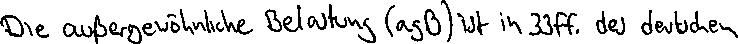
Die außergewöhnliche Belastung (agB) ist in 33 ff. des deutschen
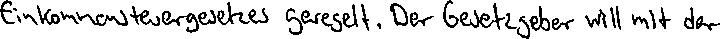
Einkommensteuergesetzes geregelt. Der Gesetzgeber will mit der
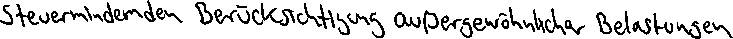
steuermindernden Berücksichtigung außergewöhnlicher Belastungen
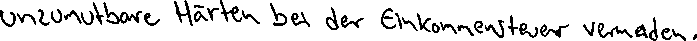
Unzumutbare Härten bei der Einkommensteuer vermeiden.
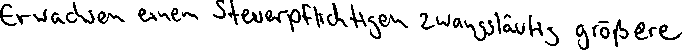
Erwachsen einem Steuerpflichtigen zwangsläufig größere
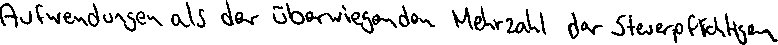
Aufwendungen als der überwiegenden Mehrzahl der Steuerpflichtigen
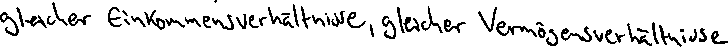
gleicher Einkommensverhältnisse, gleicher Vermögensverhältnisse
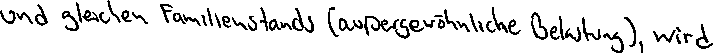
und gleichen Familienstands (außergewöhnliche Belastung), wird
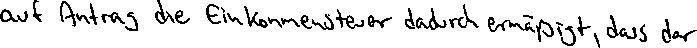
auf Antrag die Einkommensteuer dadurch ermäßigt, dass der
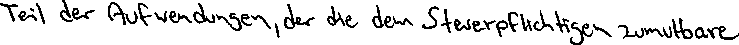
Teil der Aufwendungen, der die dem Steuerpflichtigen zumutbare
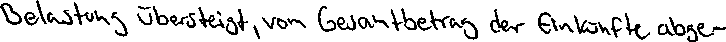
Belastung übersteigt, vom Gesamtbetrag der Einkünfte abge-
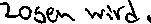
zogen wird.
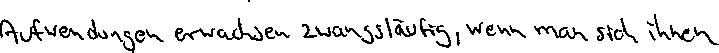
Aufwendungen erwachsen zwangsläufig, wenn man sich ihnen
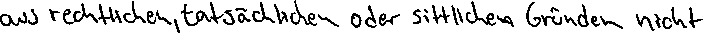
aus rechtlichen, tatsächlichen oder sittlichen Gründen nicht
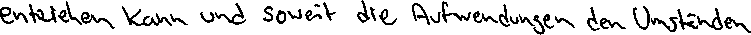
entziehen kann und soweit die Aufwendungen den Umständen
